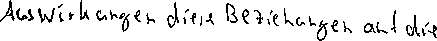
Auswirkungen diese Beziehungen auf die
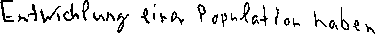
Entwicklung einer Population haben
